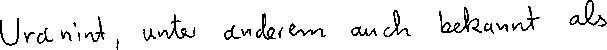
Uraninit, unter anderem auch bekannt als
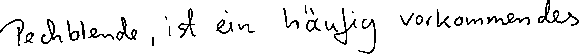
Pechblende, ist ein häufig vorkommendes
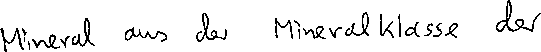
Mineral aus der Mineralklasse der
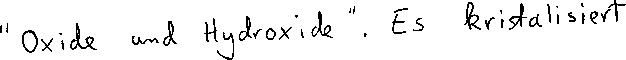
"Oxide und Hydroxide". Es kristallisiert
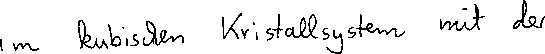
im kubischen Kristallsystem mit der
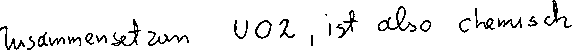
Zusammensetzung UO2, ist also chemisch
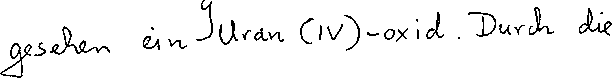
gesehen ein Uran(IV)-oxid. Durch die
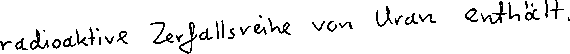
radioaktive Zerfallsreihe von Uran enthält
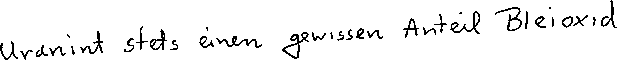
Uraninit stets einen gewissen Anteil Bleioxid
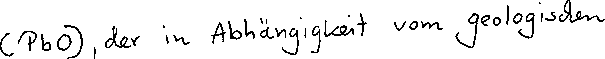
(PbO), der in Abhängigkeit vom geologischen
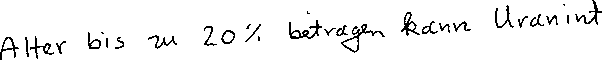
Alter bis zu 20 % betragen kann.Uraninit
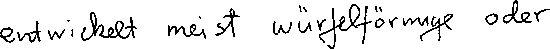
entwickelt meist würfelförmige oder
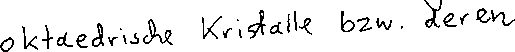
oktaedrische Kristalle bzw. deren
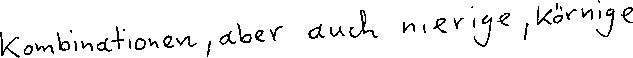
Kombinationen, aber auch nierige, körnige
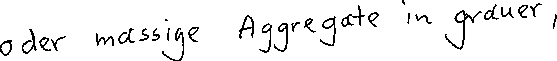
oder massige Aggregate in grauer,
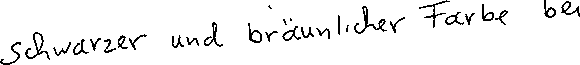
schwarzer und bräunlicher Farbe bei
